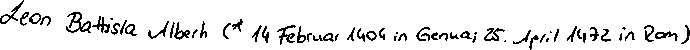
Leon Battista Alberti (* 14. Februar 1404 in Genua; 25. April 1472 in Rom)
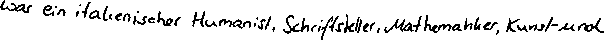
war ein italienischer Humanist, Schriftsteller, Mathematiker, Kunst- und
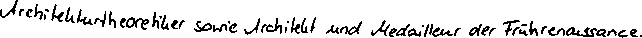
Architekturtheoretiker sowie Architekt und Medailleur der Frührenaissance.
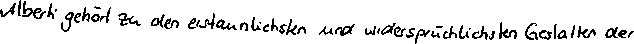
Alberti gehört zu den erstaunlichsten und widersprüchlichsten Gestalten der
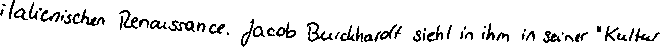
italienischen Renaissance. Jacob Burckhardt sieht in ihm in seiner "Kultur
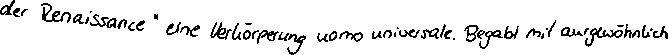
der Renaissance" eine Verkörperung des uomo universale. Begabt mit außergewöhnlich
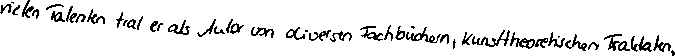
vielen Talenten trat er als Autor von diversen Fachbüchern, kunsttheoretischen Traktaten,
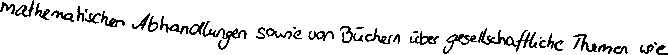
mathematischen Abhandlungen sowie von Büchern über gesellschaftliche Themen wie
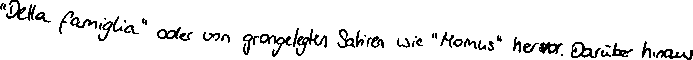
"Della famiglia" oder von großangelegten Satiren wie "Momus" hervor. Darüber hinaus
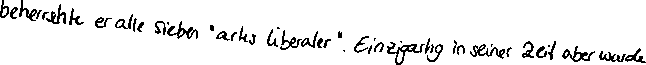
beherrschte er alle sieben "artes liberales". Einzigartig in seiner Zeit aber wurde
